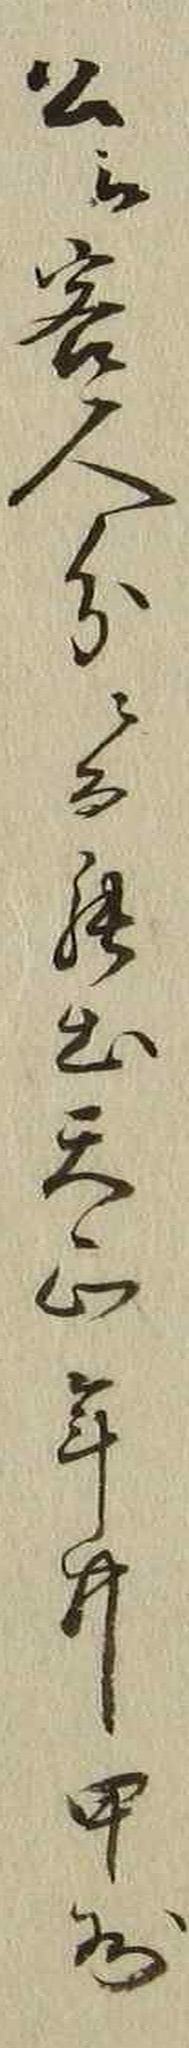公江客人分ニ而罷出天正年中甲州
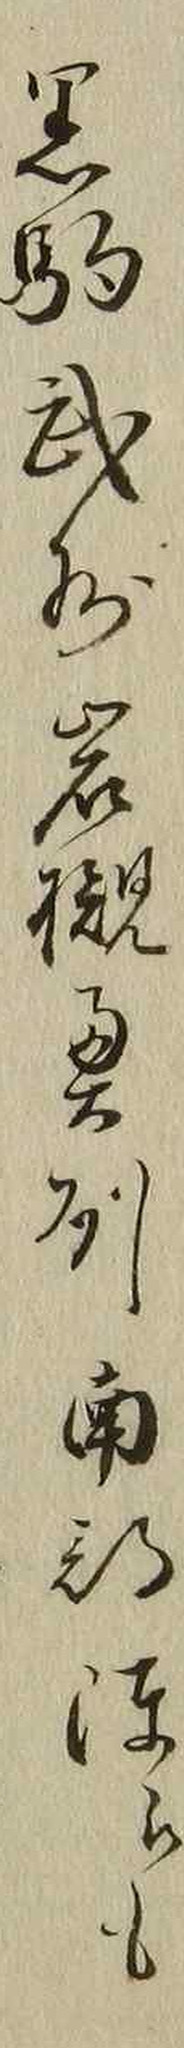黒駒武州岩槻奥州南部陣江も
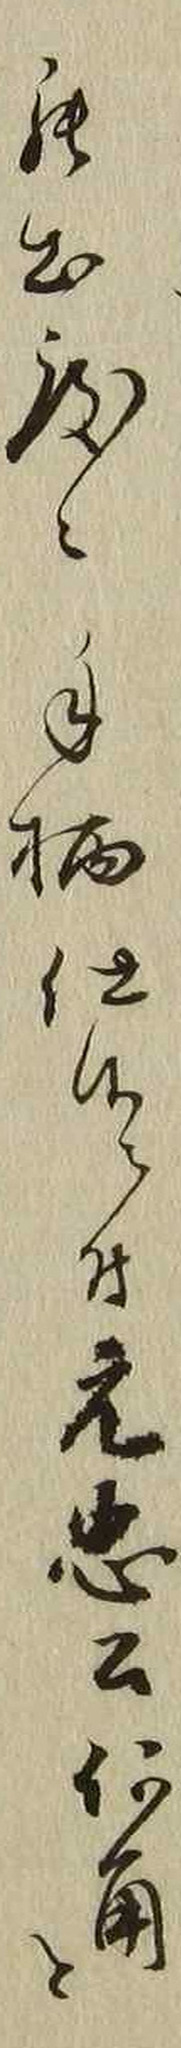罷出度々手柄仕候ニ付元忠公何角と
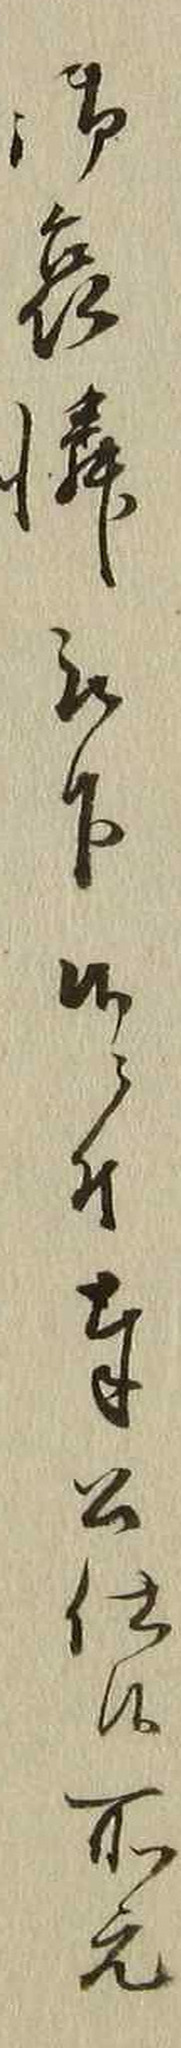御哀隣被下候ニ付奉公仕候所元
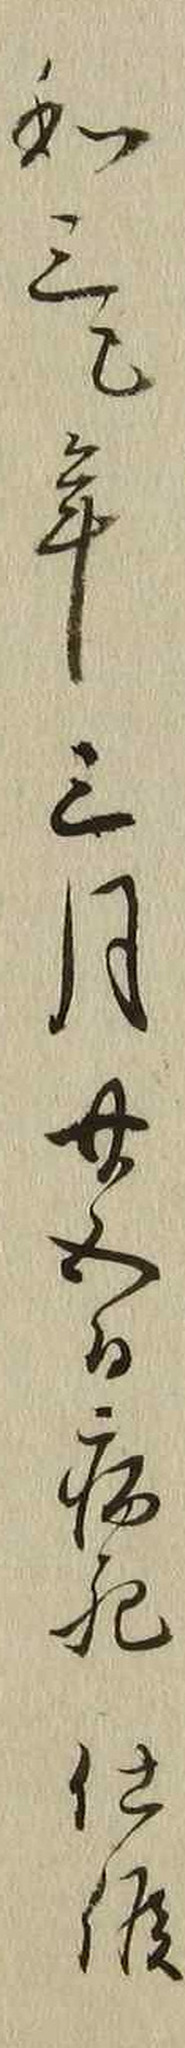和三巳年三月廿五日病死仕候
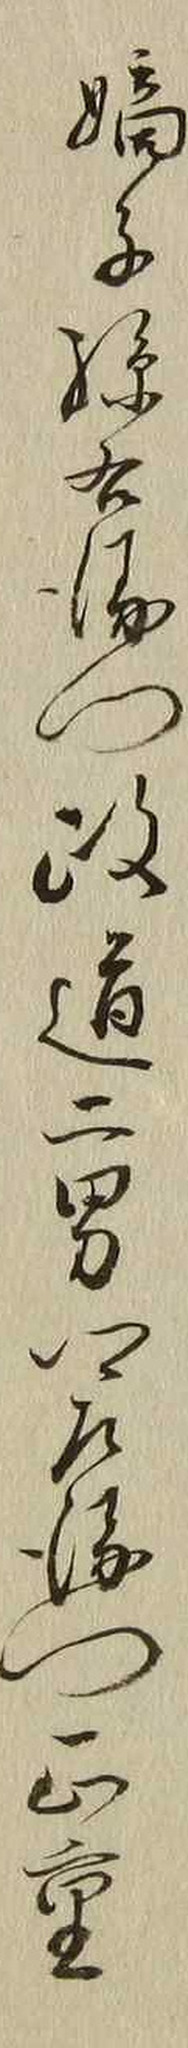嫡子孫右衛門政道二男郷左衛門正重
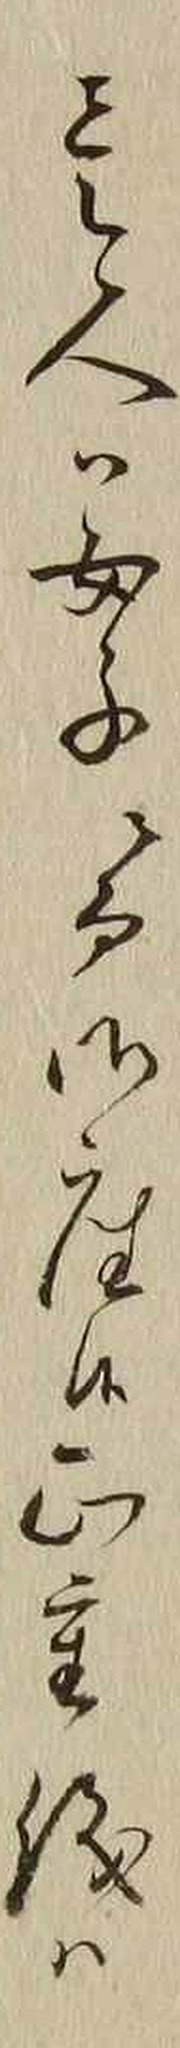壱人ハ女子ニ而御座候正重儀ハ
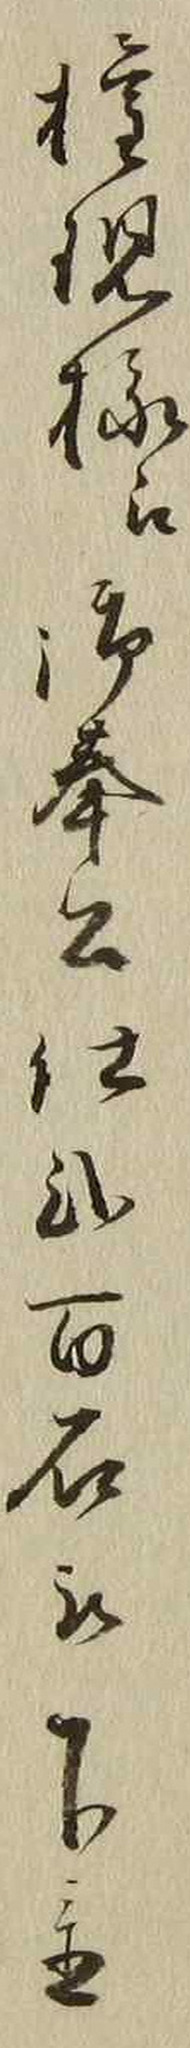権現様江御奉公仕弐百石被下置
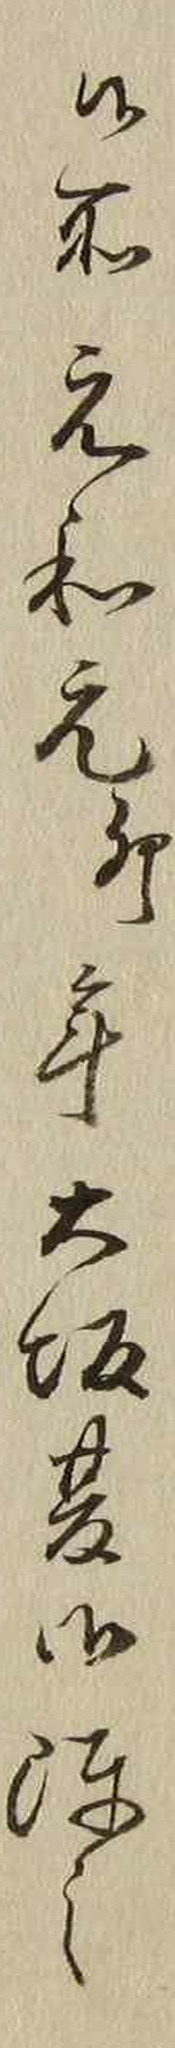候所元和元卯年大坂夏御陣之
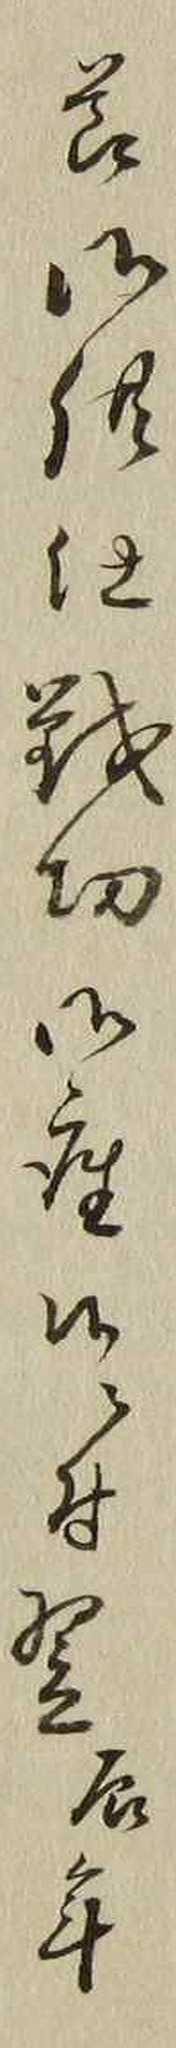節御供仕戦功御座候ニ付翌辰年
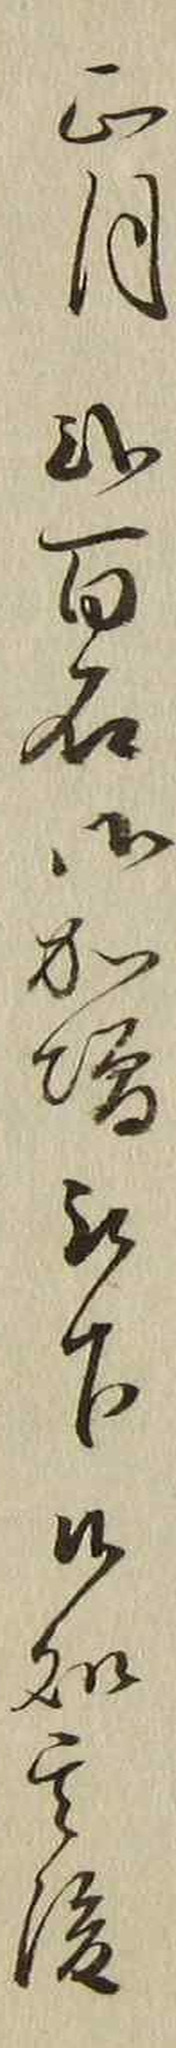正月弐百石御加増被下候処其後
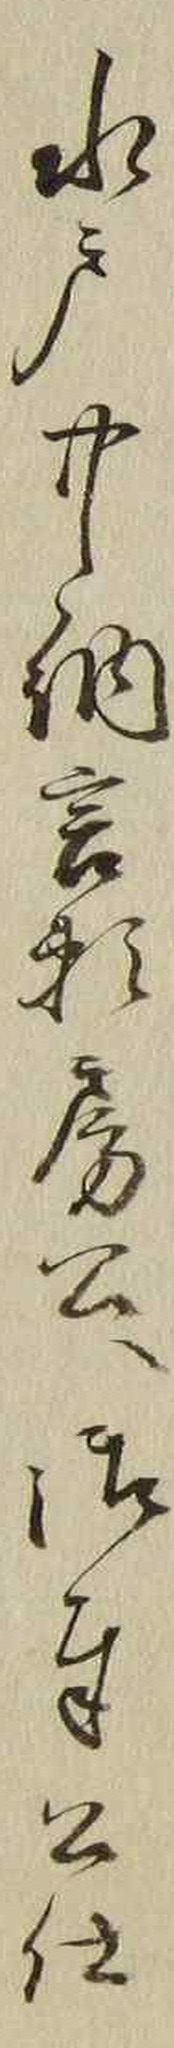水戸中納言頼房公ヘ御奉公仕
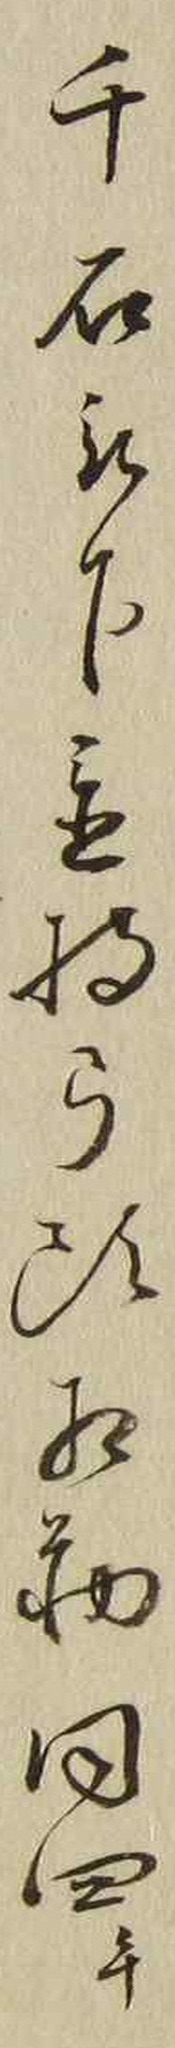千石被下置持弓頭相勤同四午

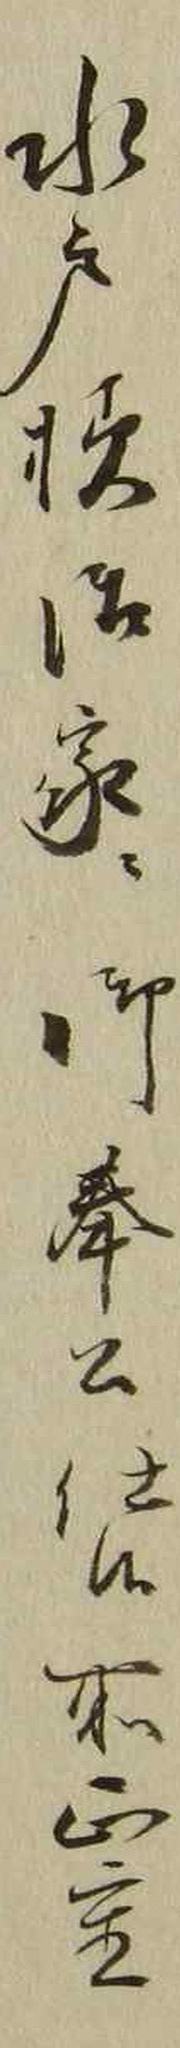水戸様御家ニ御奉公仕候所正重
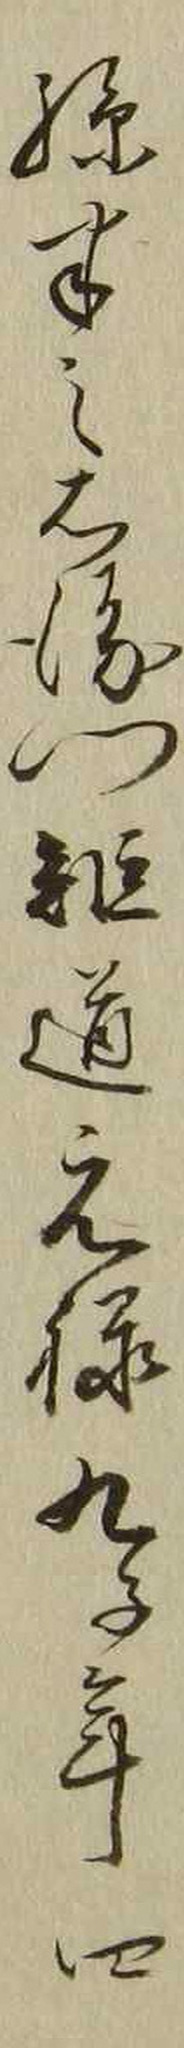孫半之右衛門矩通元禄九子年四
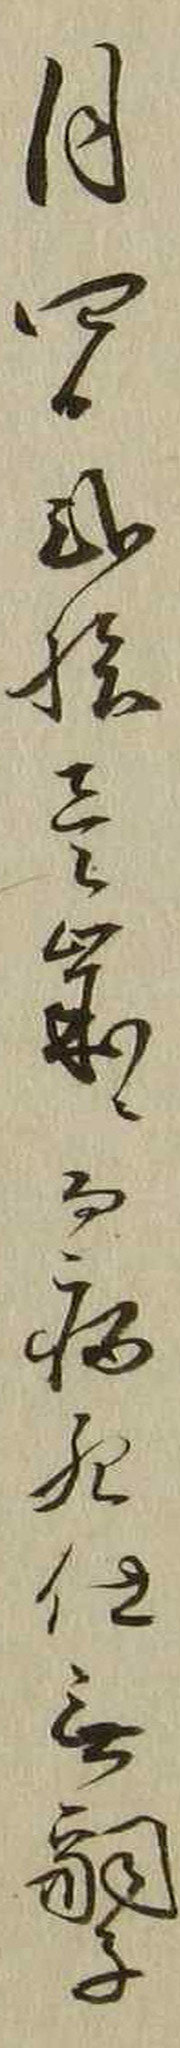月四日弐拾壱歳ニ而病死仕無嫡子
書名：諸士系譜　巻之68　を之部2
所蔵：会津若松市立会津図書館
